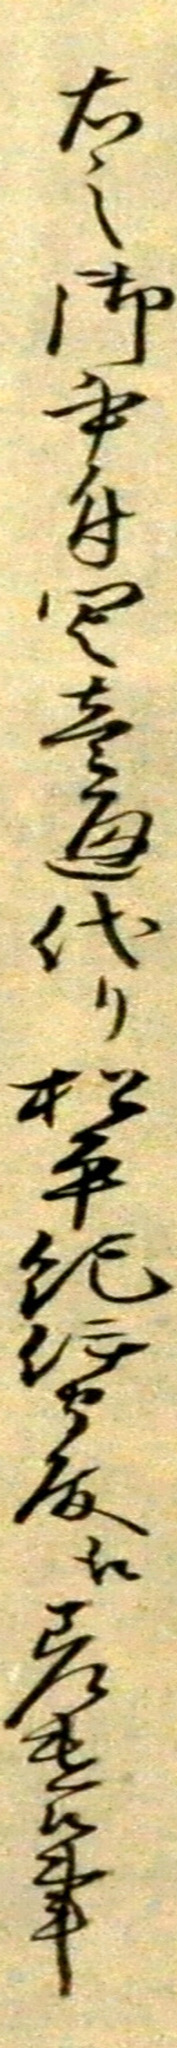右之御書付写壱通代ㇼ松平紀伊守殿江差遣候事
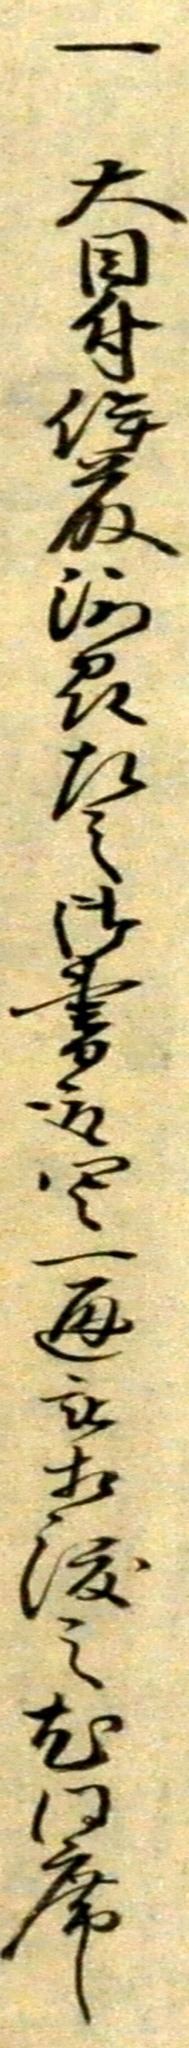一大目付伊藤河州左之御書取写一通被相渡之尤同席
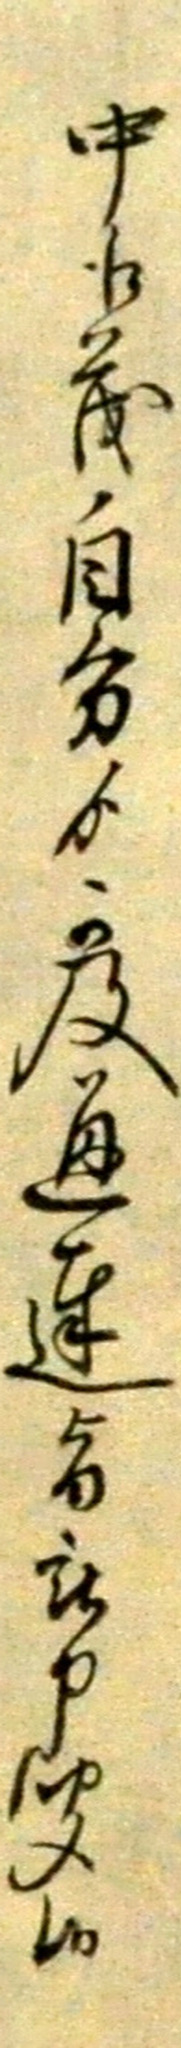中江茂自分ゟ可及通達旨被申聞候
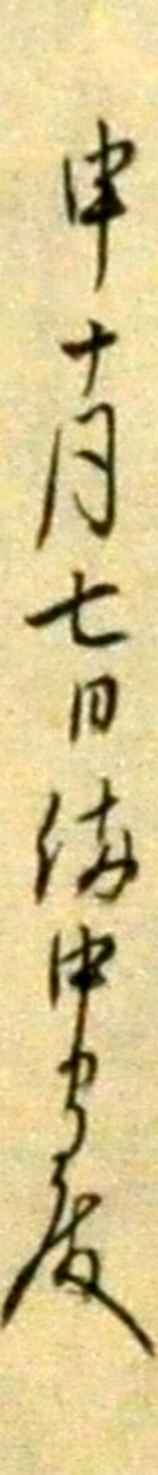十月七日備中守殿
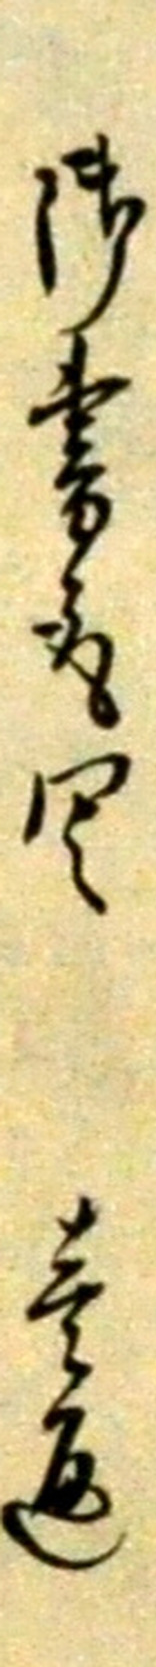御書取写壱通
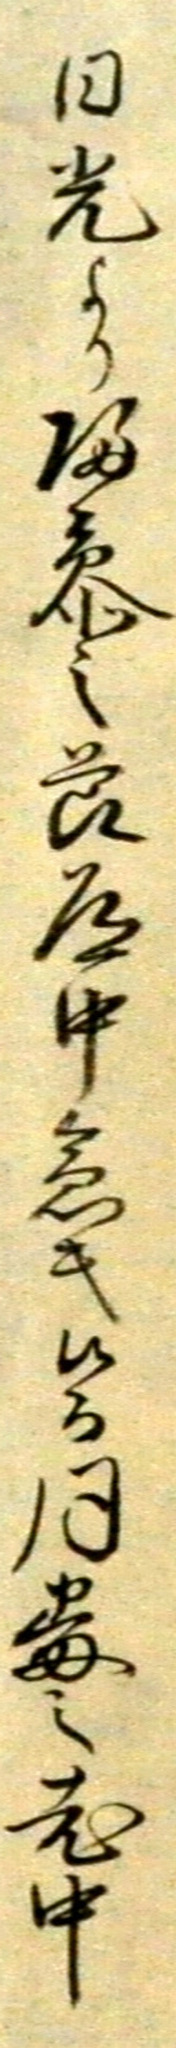日光より帰参之節道中急キ候而月番之老中
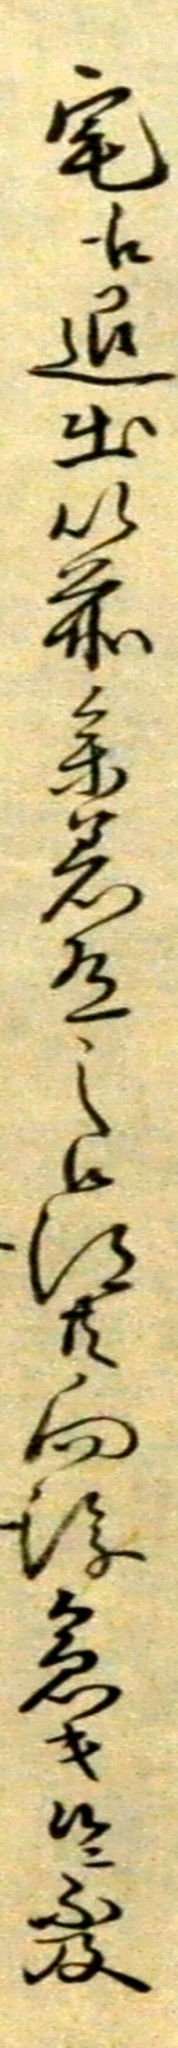宅江退出以前参着有之候得共向後急キ候二不及
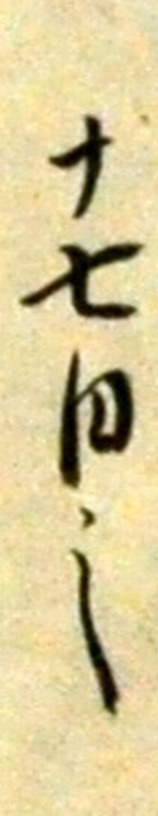十七日之
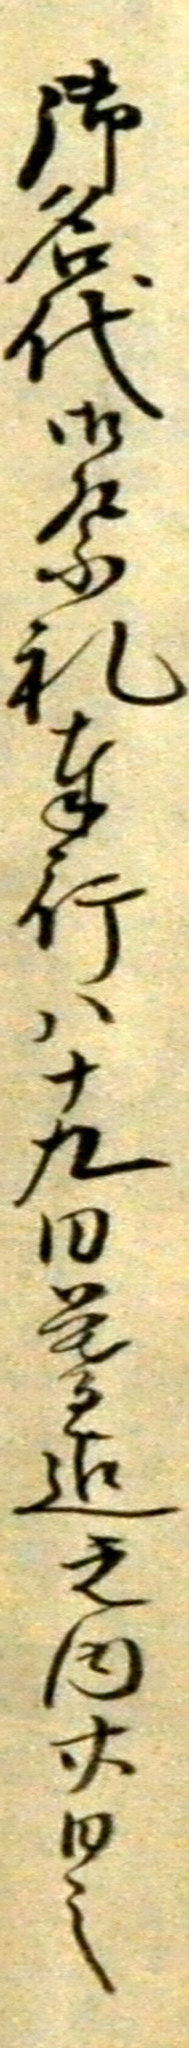御名代御祭礼奉行ハ十九日暮迠之内廿日之
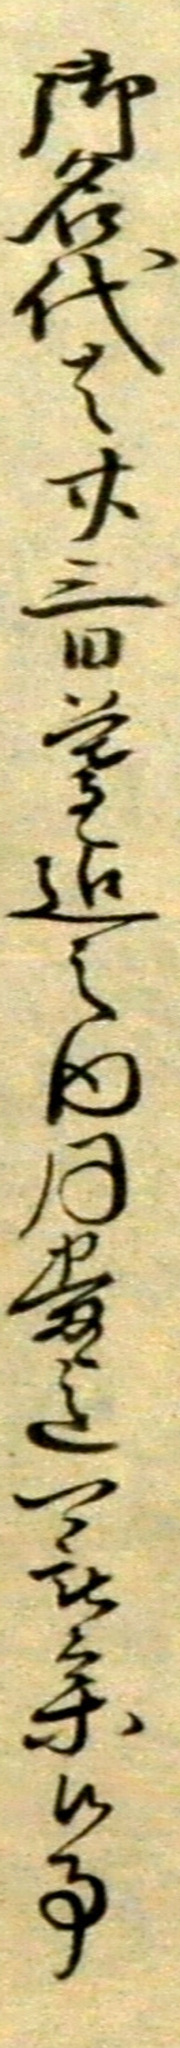御名代者廿三日暮迠之内月番迠可被参候事

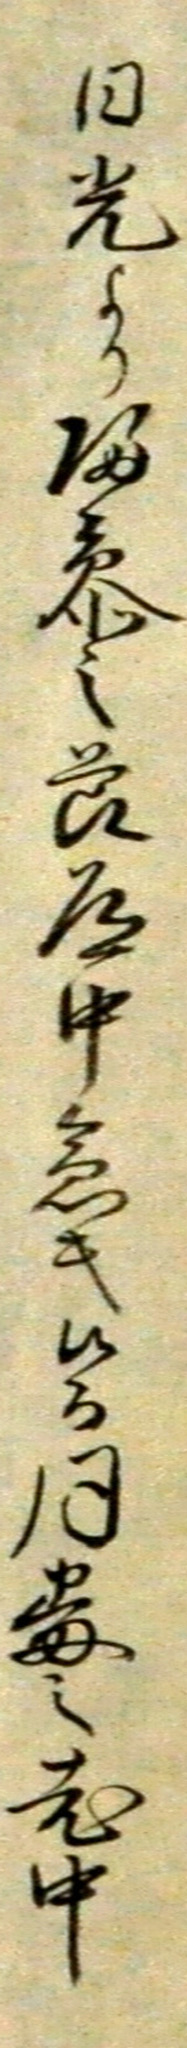日光より帰参之節道中急キ候而月番之老中
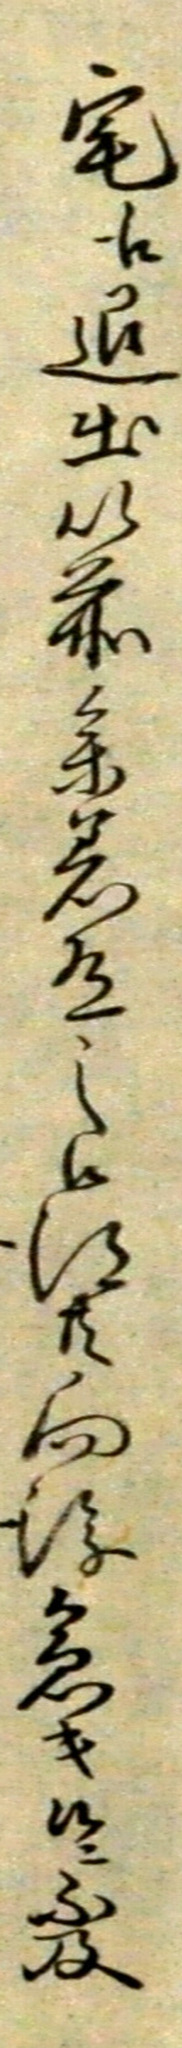宅江退出以前参着有之候得共向後急キ候ニ不及
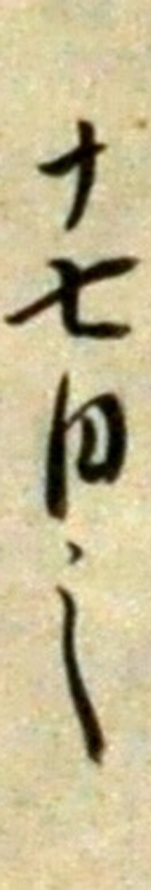十七日之
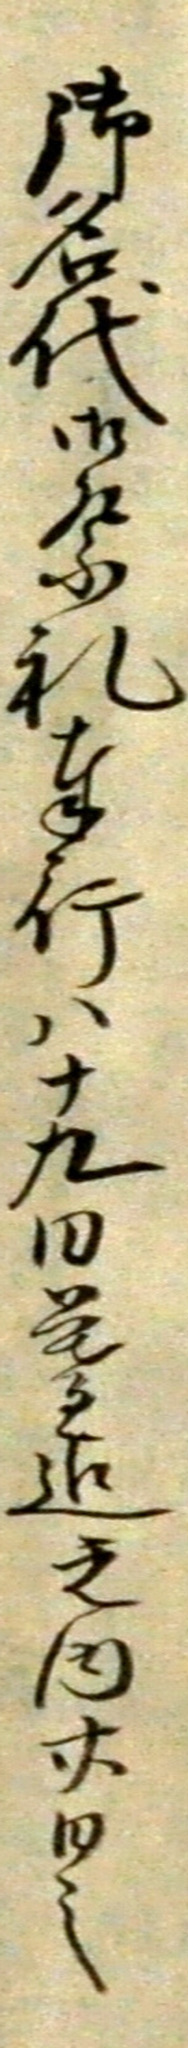御名代御祭禮奉行ハ十九日暮迠之内廿日之
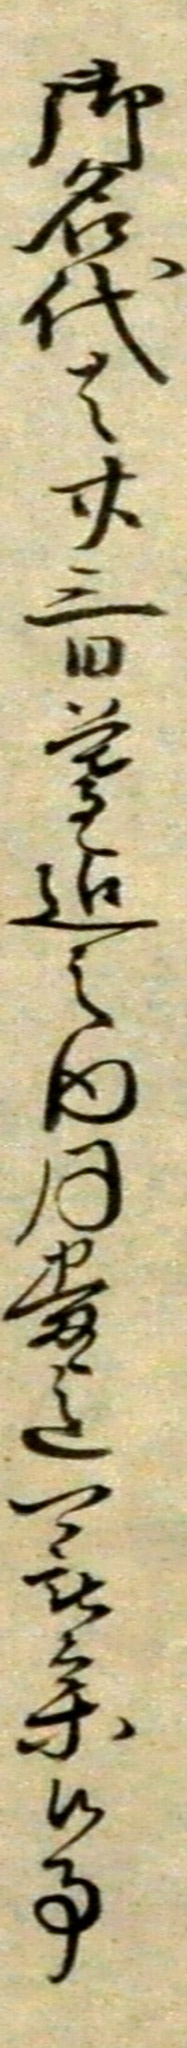御名代者廿三日暮迠之内月番迠可被参候事
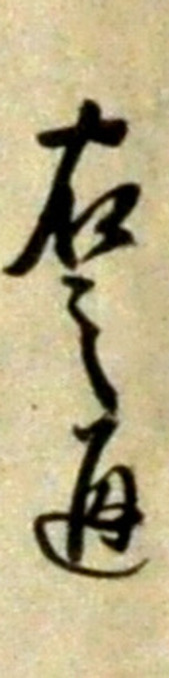右之通
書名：日光御名代相勤候節ノ留
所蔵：伊那市立高遠町図書館・合同会社AMANE
